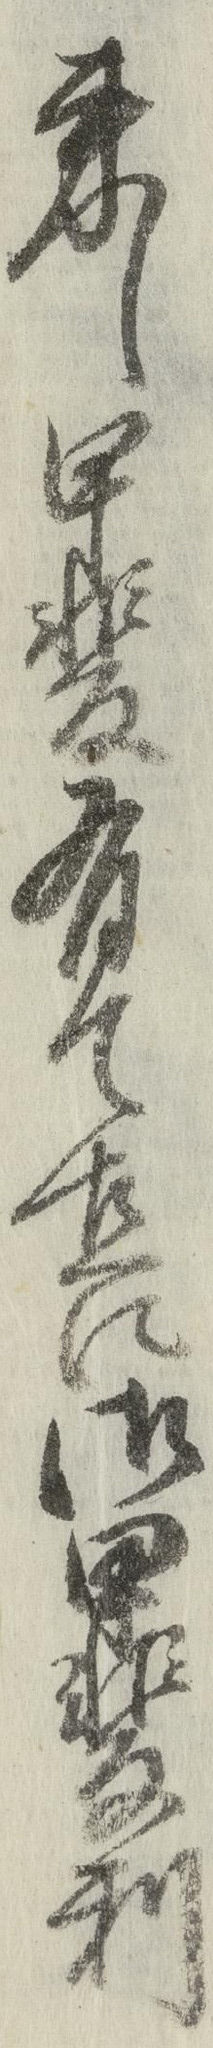来し甲斐有て直に御甲斐利
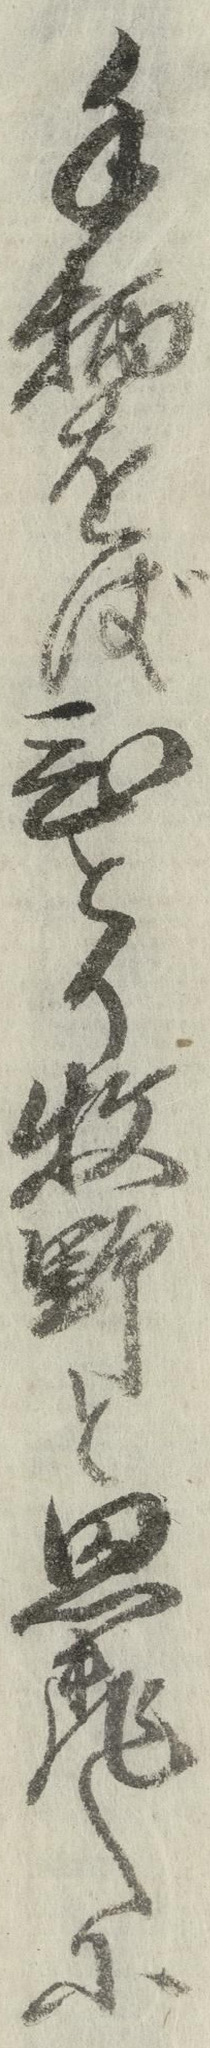手柄をばひとり牧野と思ひしに
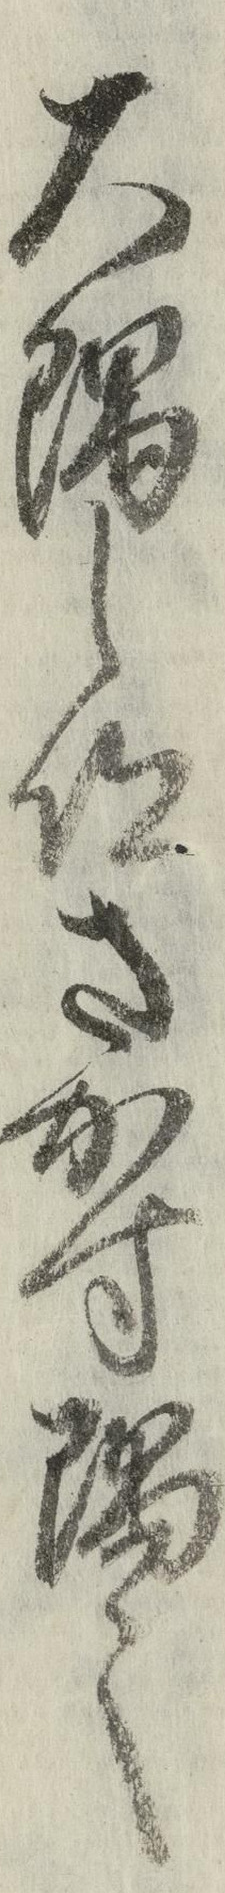大隅之跡さかす隅〻
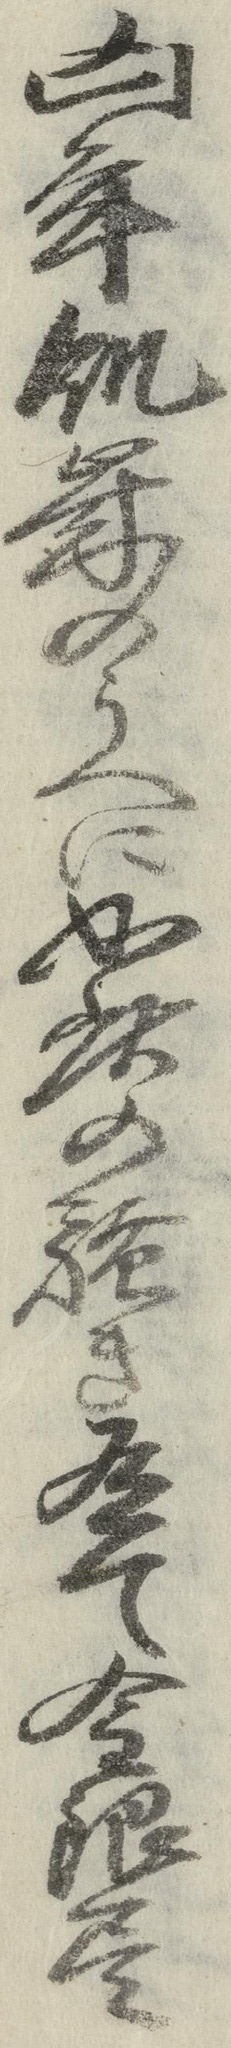凶年飢歳のうへに如此の騒き有て金銀尽

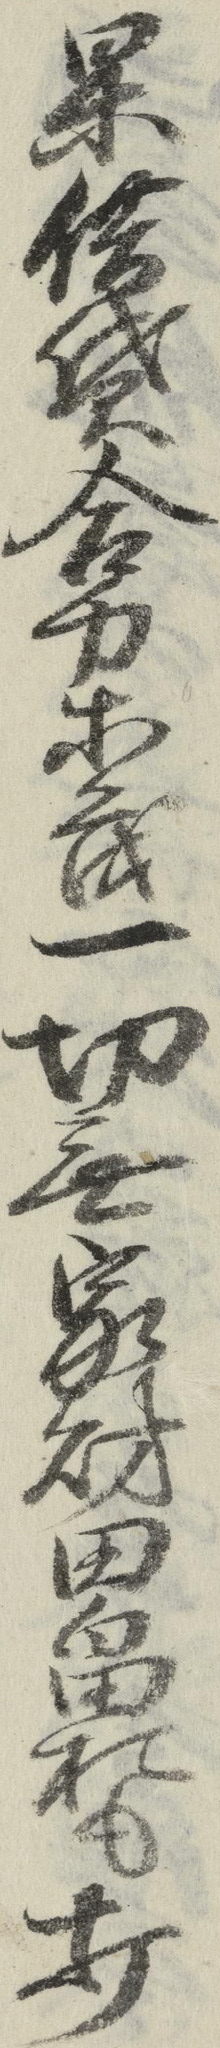果借貸合力等も一切無家財田畠おも打
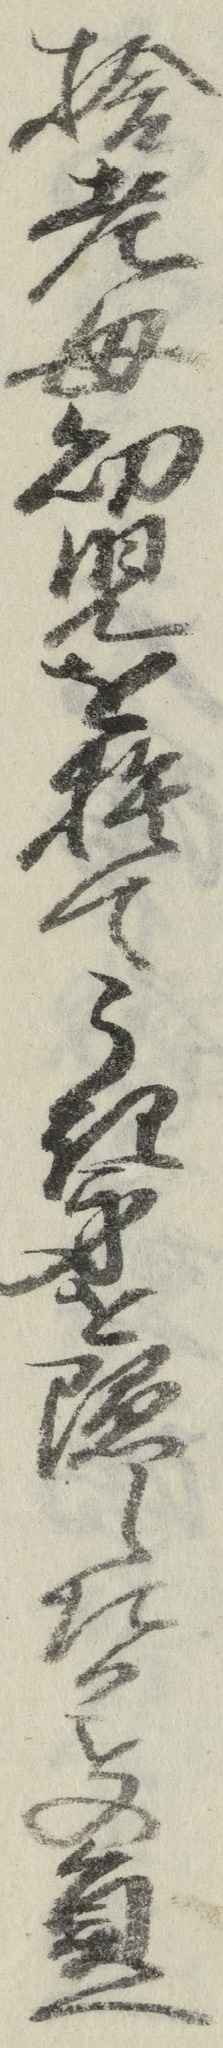捨老母幼児を捨てうき身を隠したるもの員へ
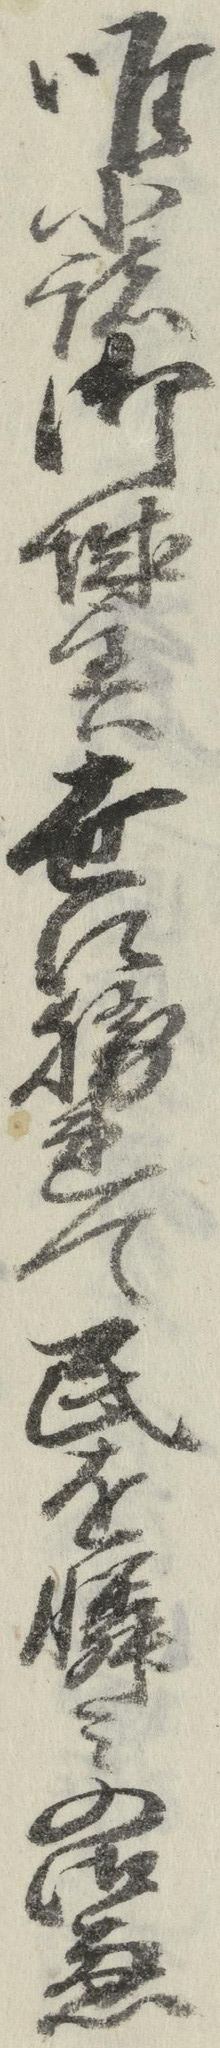唯小諸御城主は世に勝れて民を憐みの御恵
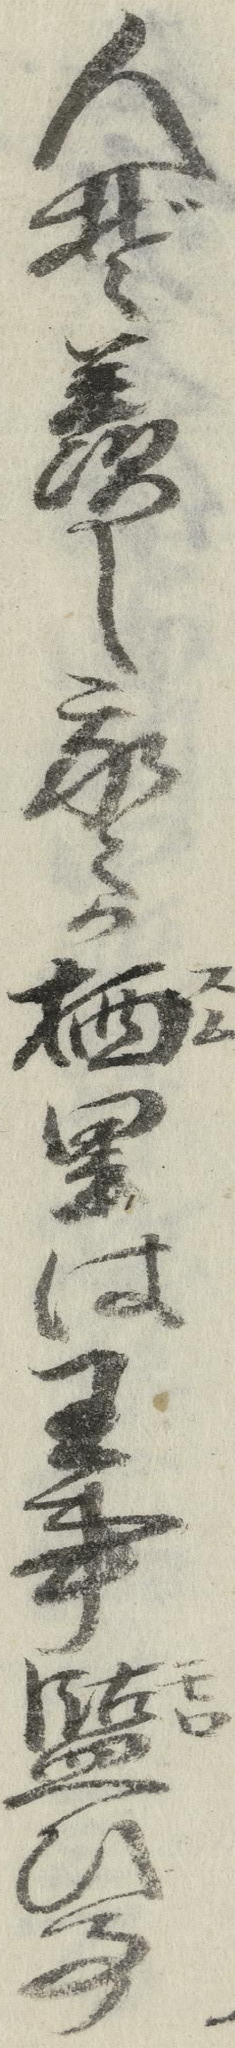人ぞ羨し我々か栖里は王事盬ひ事
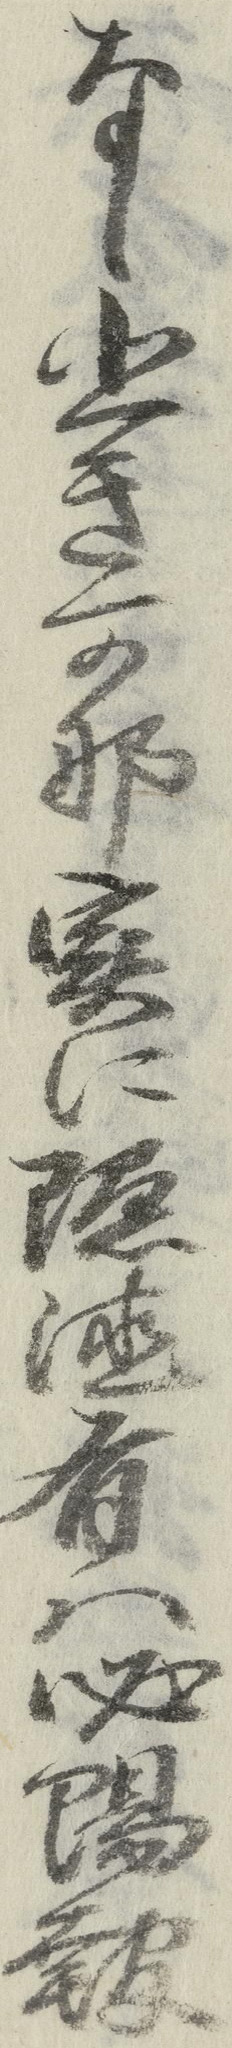なし悲きかな実に隠徳有は必陽報
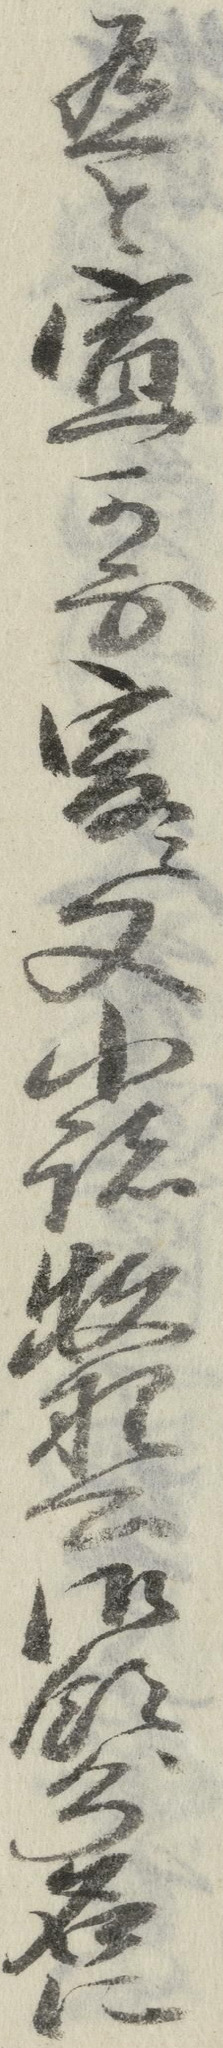有と宣かな爰に又小諸牧野公御領分名に
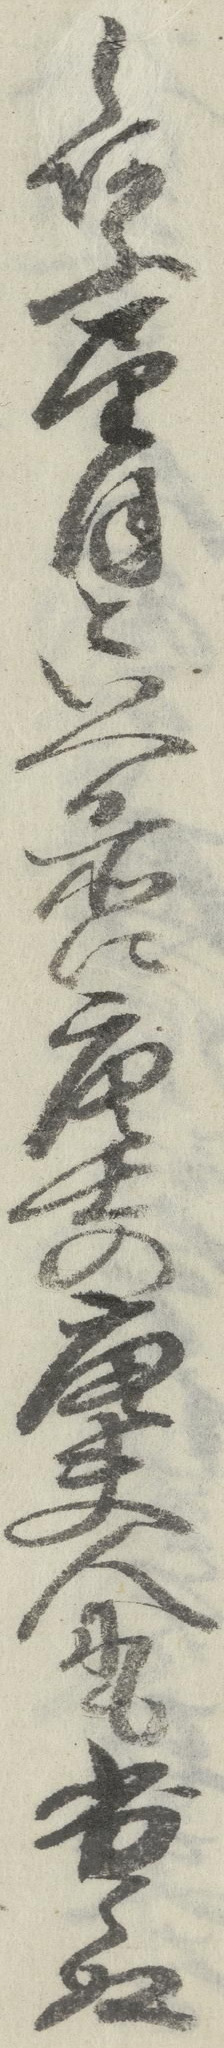しあふ望月といへる所に唐士の唐夫人にも劣らぬ
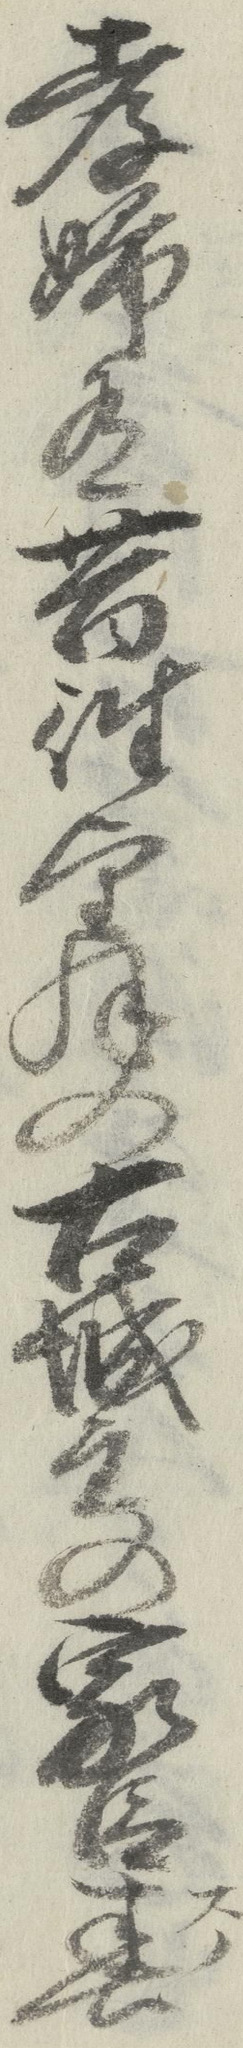孝婦有昔徃望月の古城主の家臣春
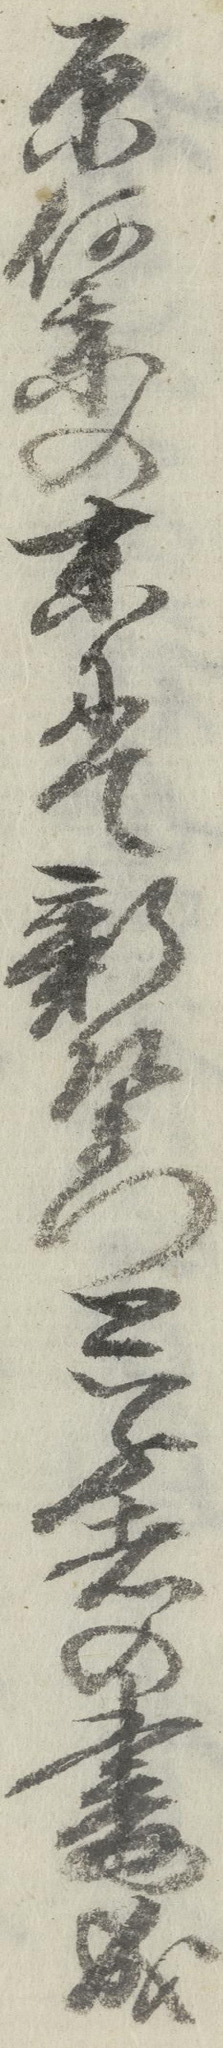原何某の末にて新左衛門といふ者の妻成
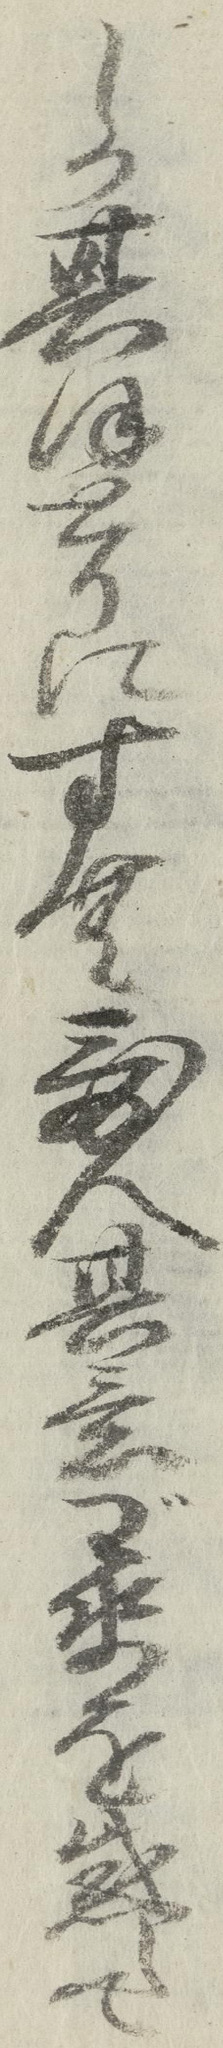しか其ほとりにすむ寄人其意ば勢を惑して
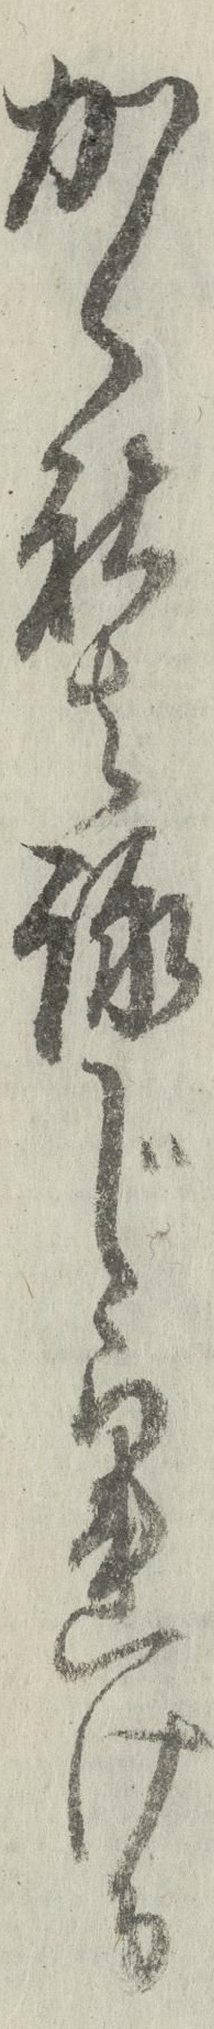から秋は詠じられける
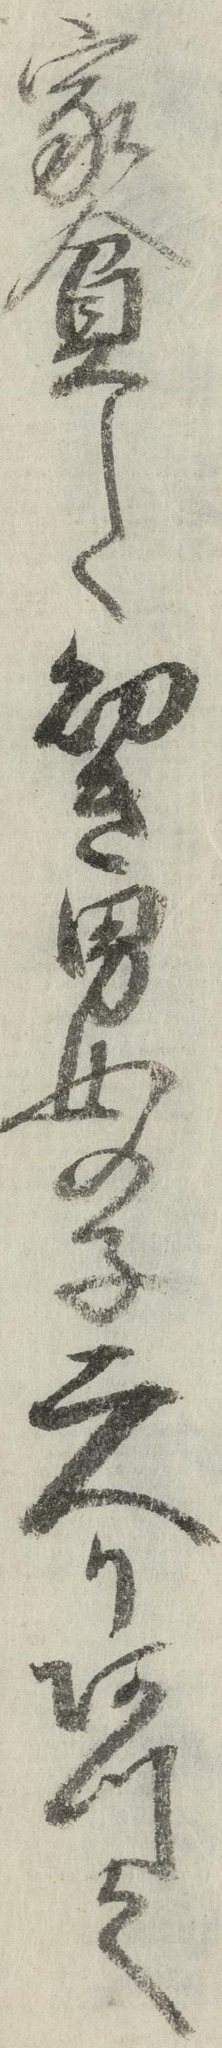家貧しく幼き男女の子二人りあつて
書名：浅間大焼騒動記　下
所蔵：東京大学地震研究所図書室 Earthquake Research Institute Library, The University of Tokyo, JAPAN
